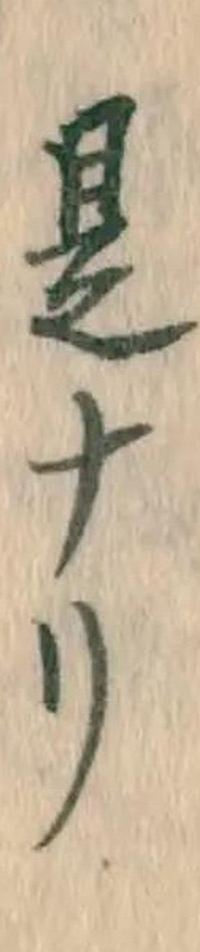是ナリ
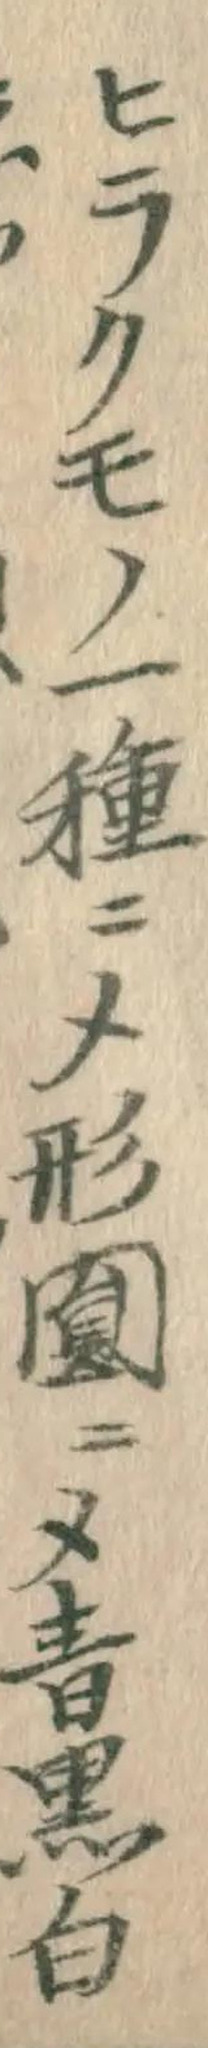ヒラクモノ一種ニシテ形圎ニシテ青黒白
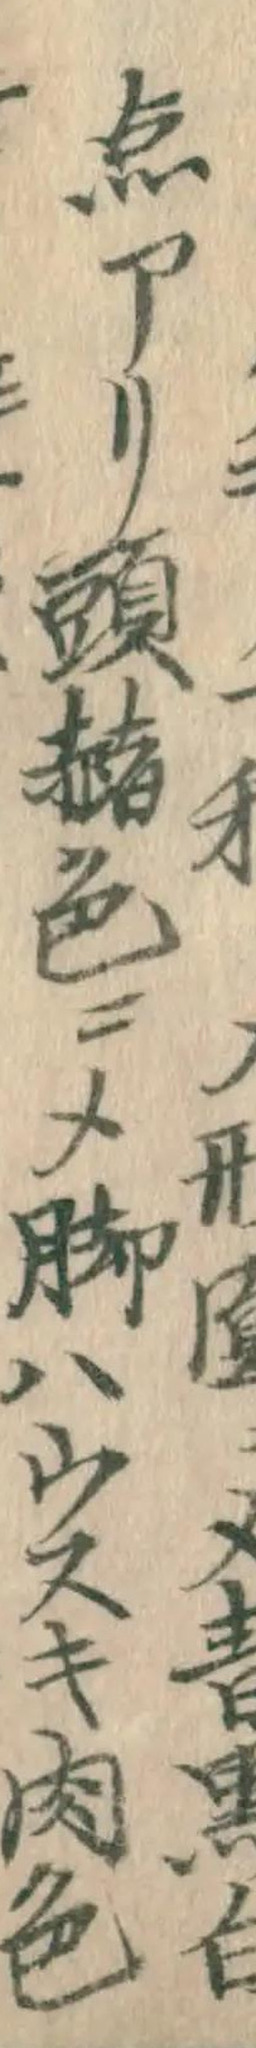点アリ頭赭色ニシテ脚ハウスキ肉色
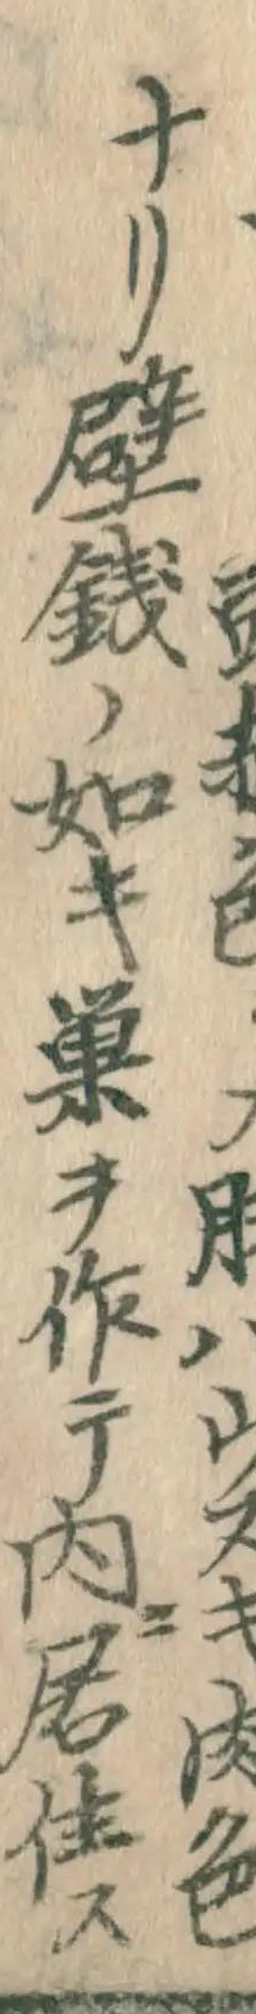ナリ壁銭ノ如キ巣ヲ作テ内ニ居住ス

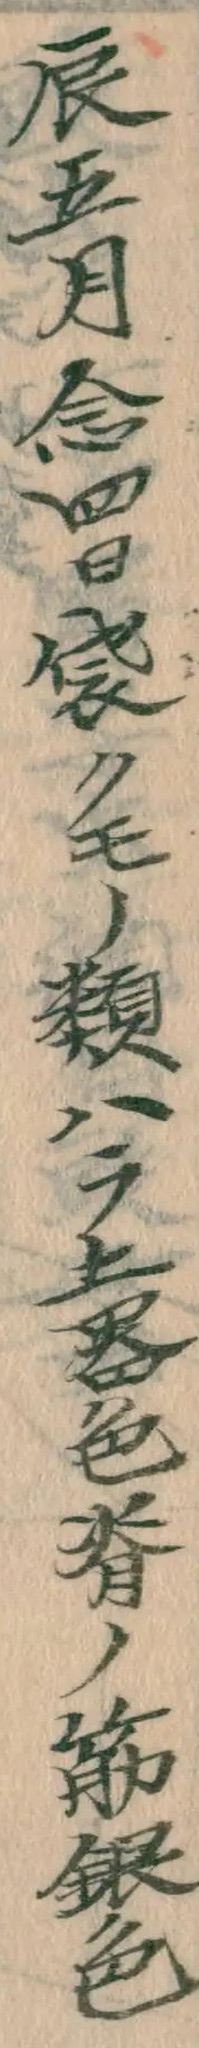辰五月念四日袋クモノ類ハラ土器色脊ノ筋銀色
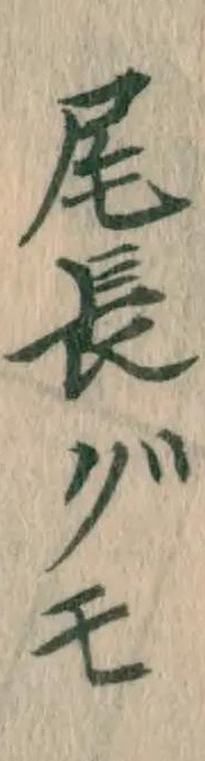尾長グモ

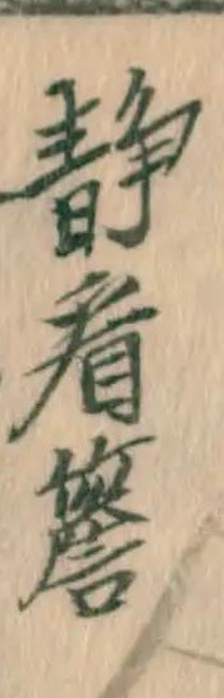静看簷
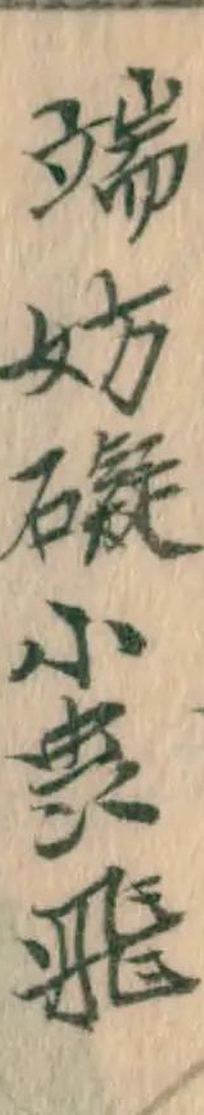端妨礙小蟲飛
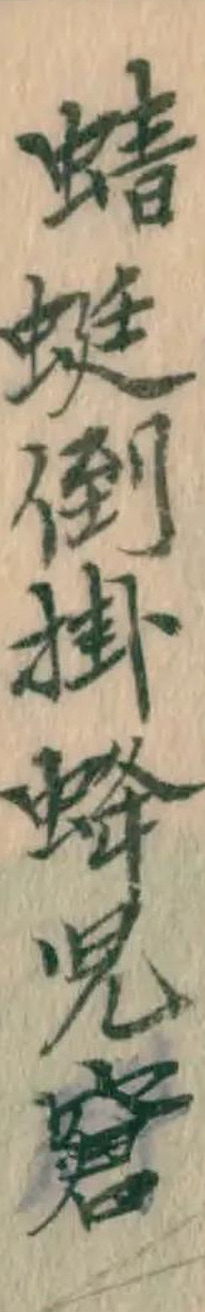蜻蜓倒掛蜂児窘
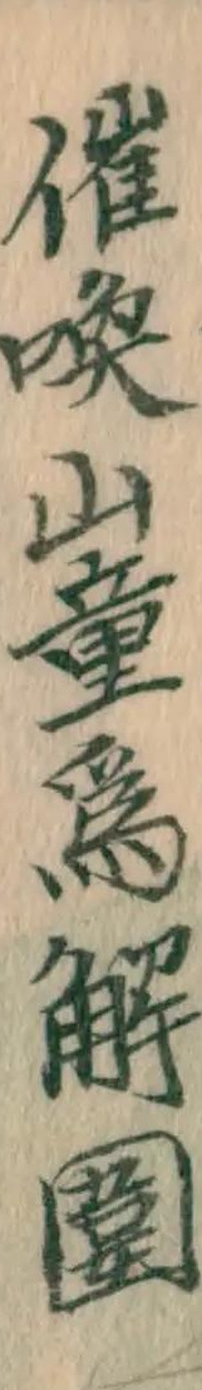催喚山童爲解圍
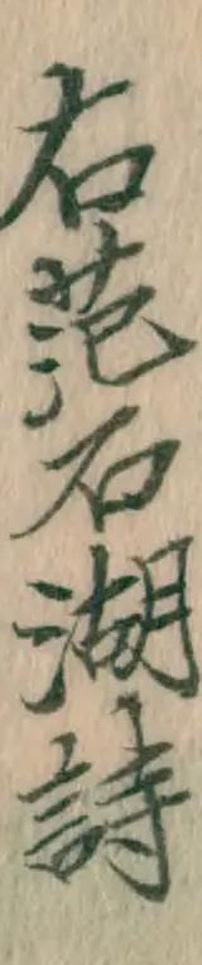右范石湖詩
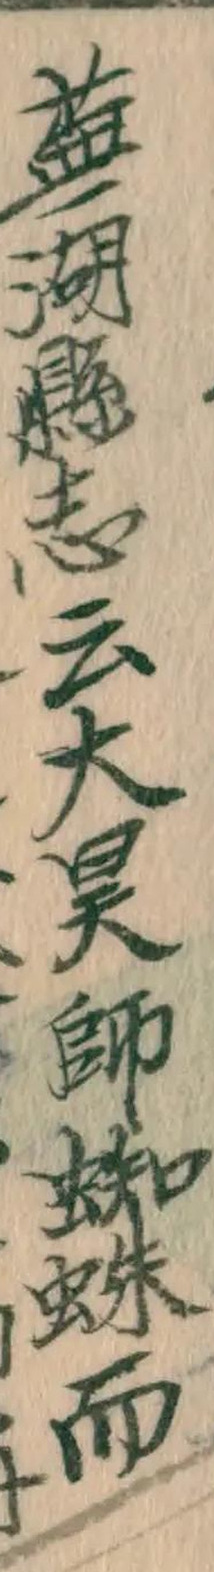蕪湖縣志云大昊師蜘蛛而
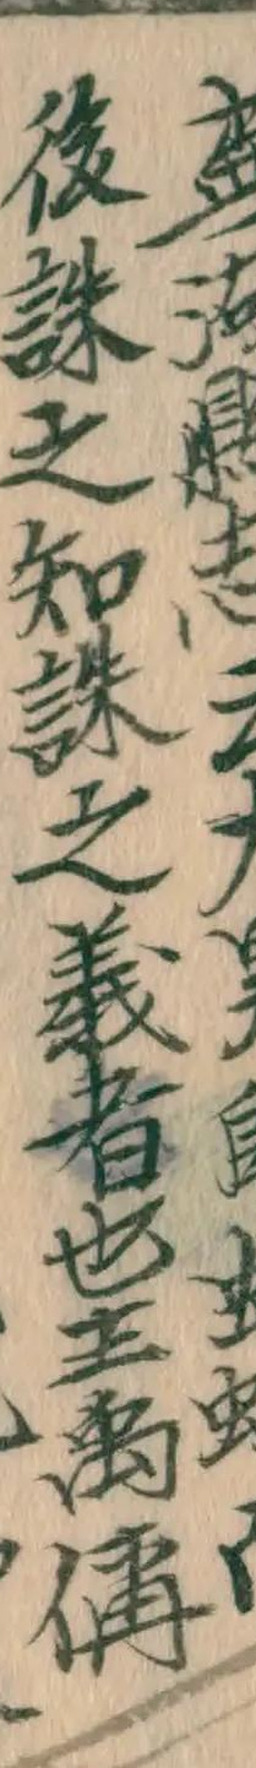後誅之知誅之義者也王禹偁
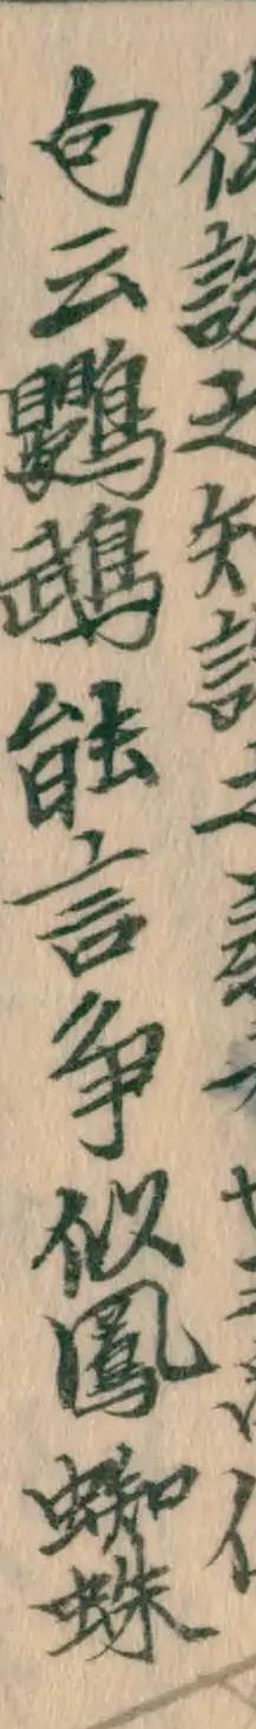句云鸚鵡能言争似鳳蜘蛛
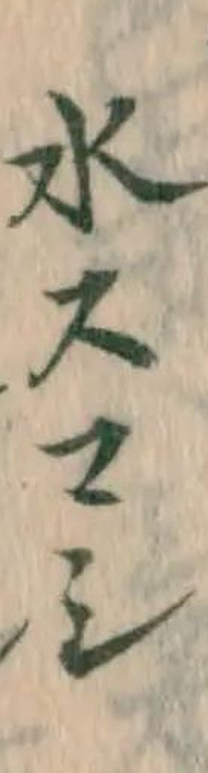水スマシ
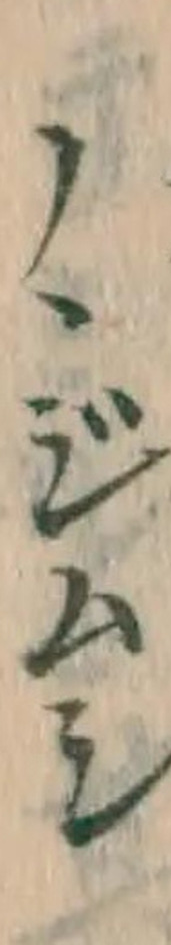ノヽジムシ
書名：千蟲譜 3巻. [2]
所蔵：国立国会図書館 National Diet Library, JAPAN
